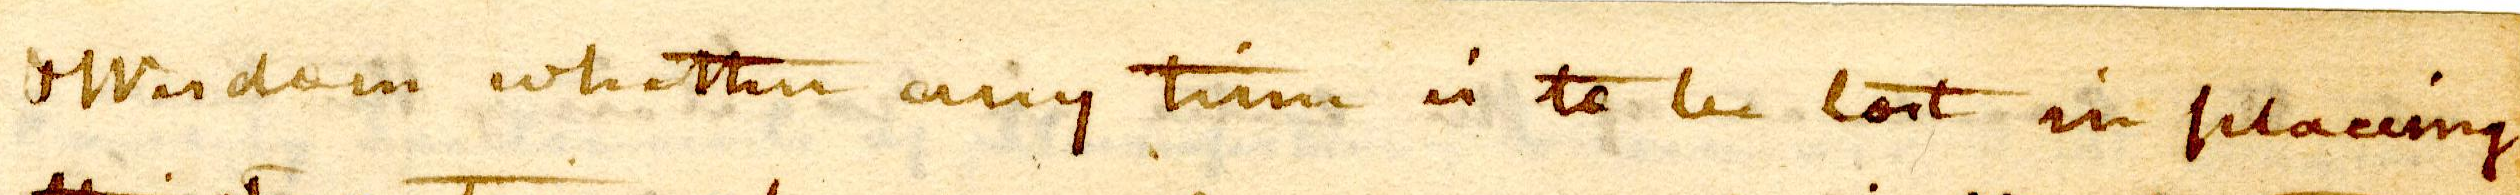& Wisdom whether any time is to be lost in placing
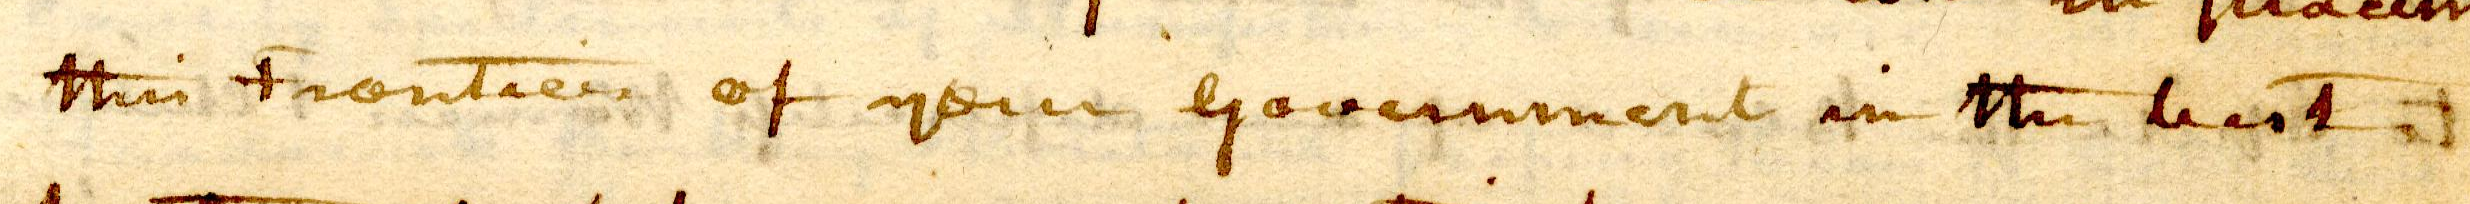this Frontier of your Government in the best
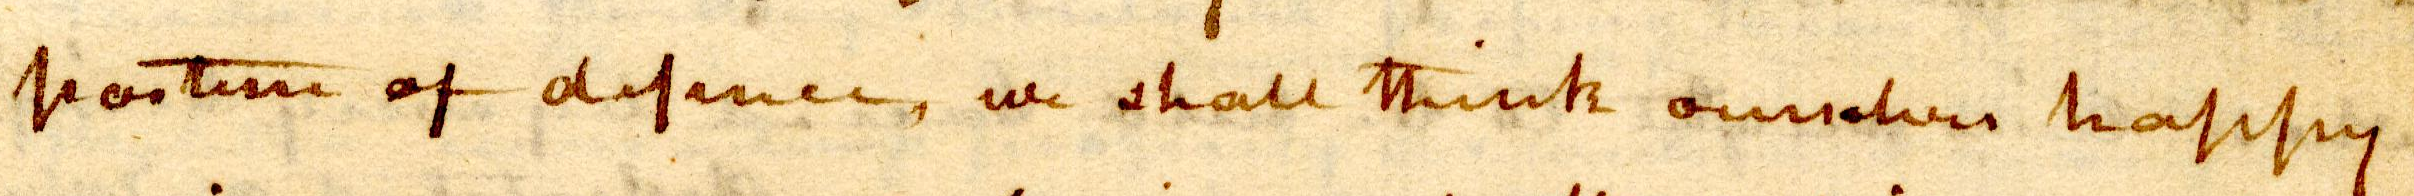posture of defence, we shall think ourselves happy
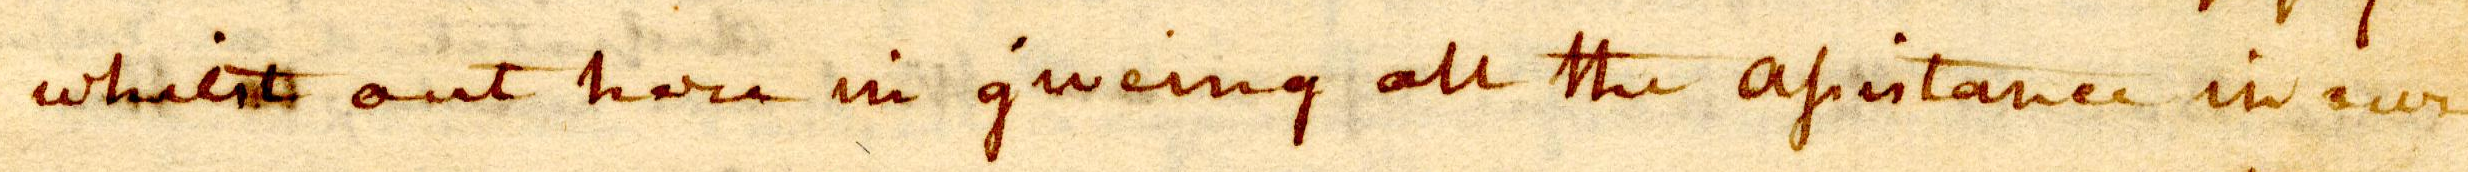whilst out here in giveing all the assistance in our
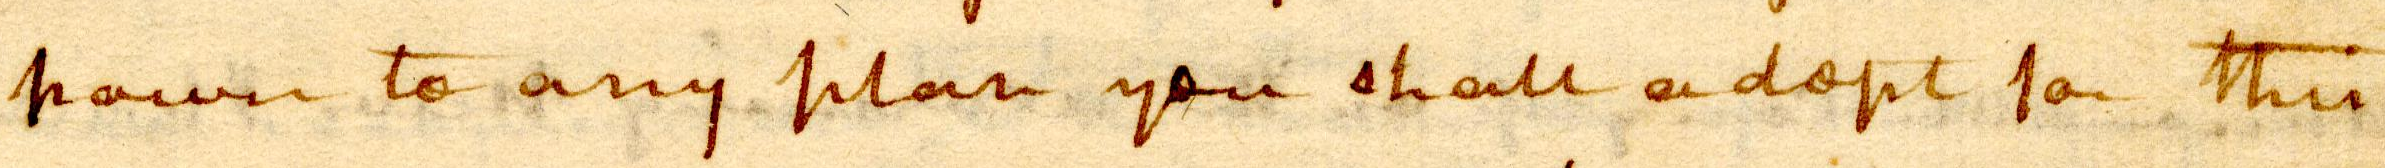power to any plan you shall adopt for this
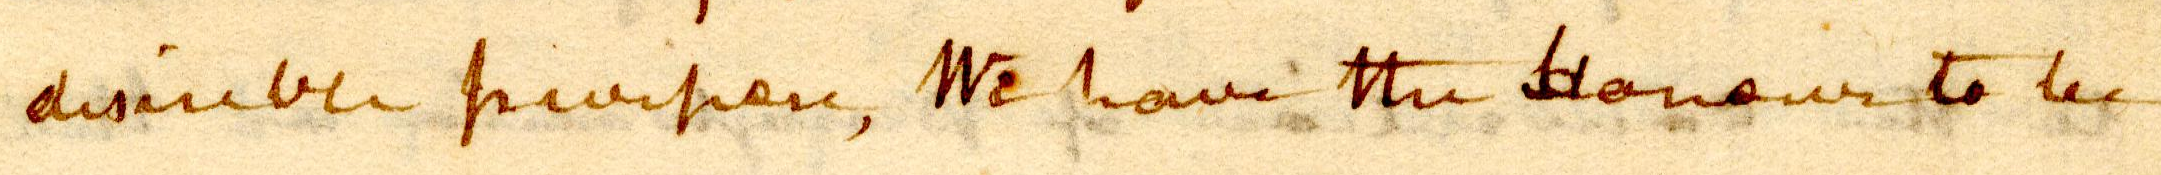desirable purpose, We have the Honour to be
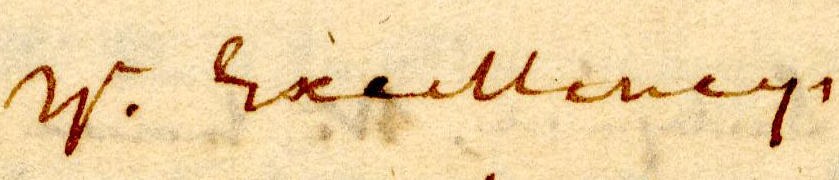Y^r. Excellency,
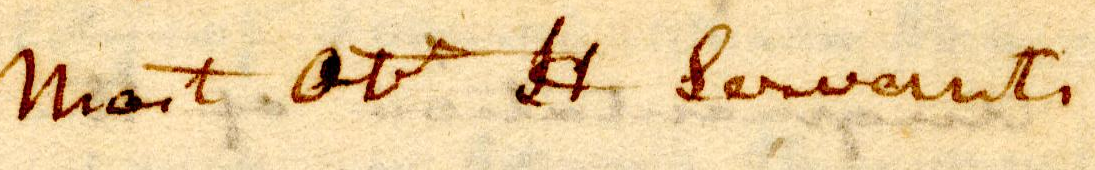Most Ob^t H Servants
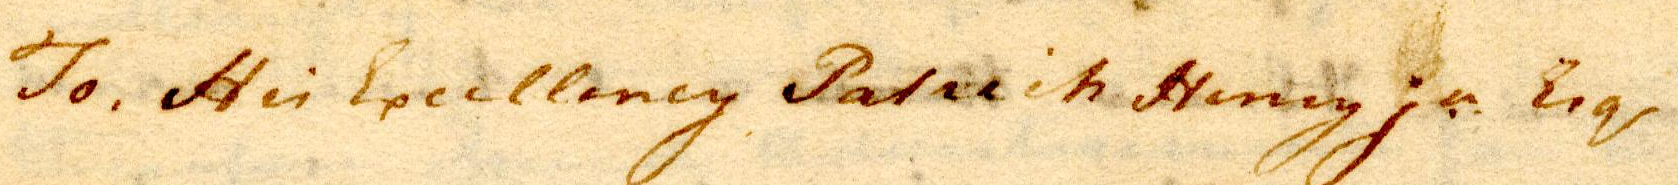To His Excellency Patrick Henry jn Esq
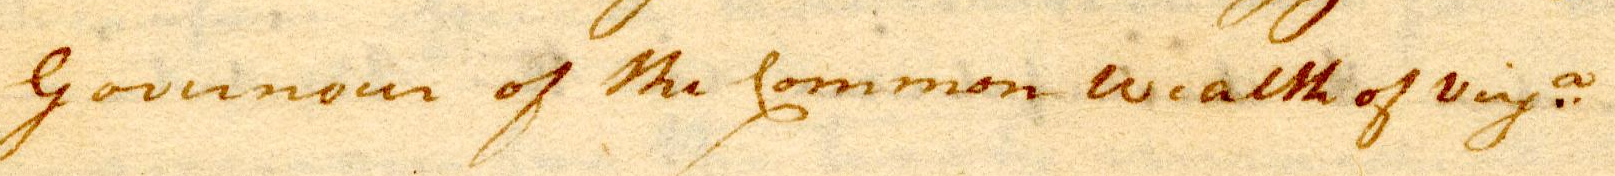Governour of the Common Wealth of Virg^a.
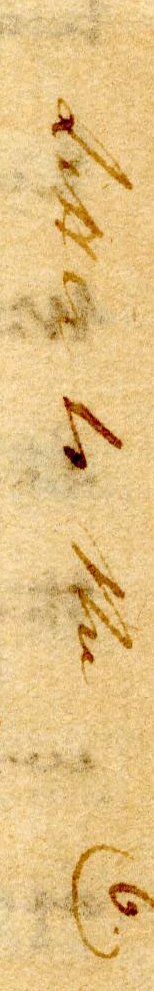Letter to the 6
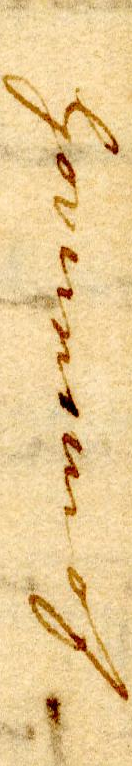Governour of
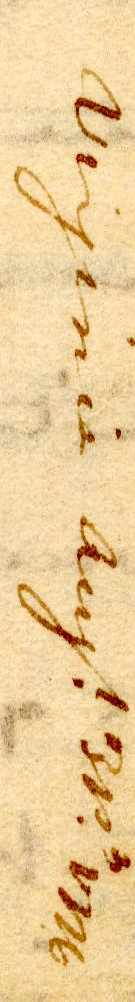Virginia Aug^t. 31^st. 1776
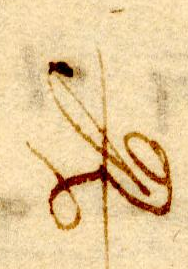R
